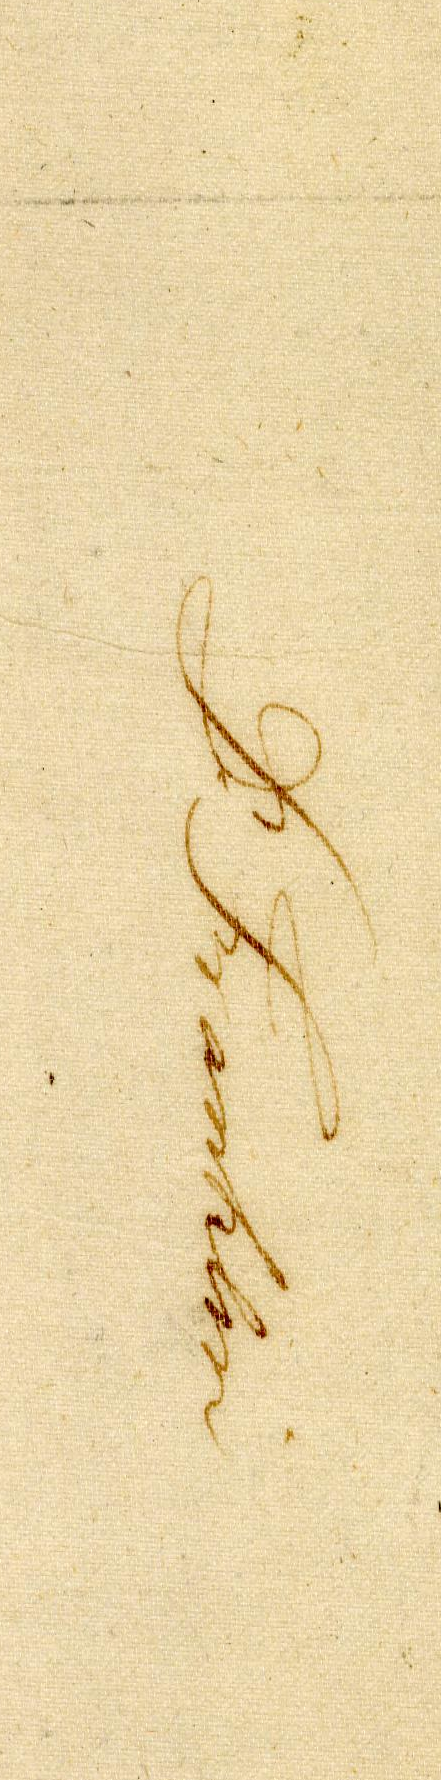D^r. Franklin
